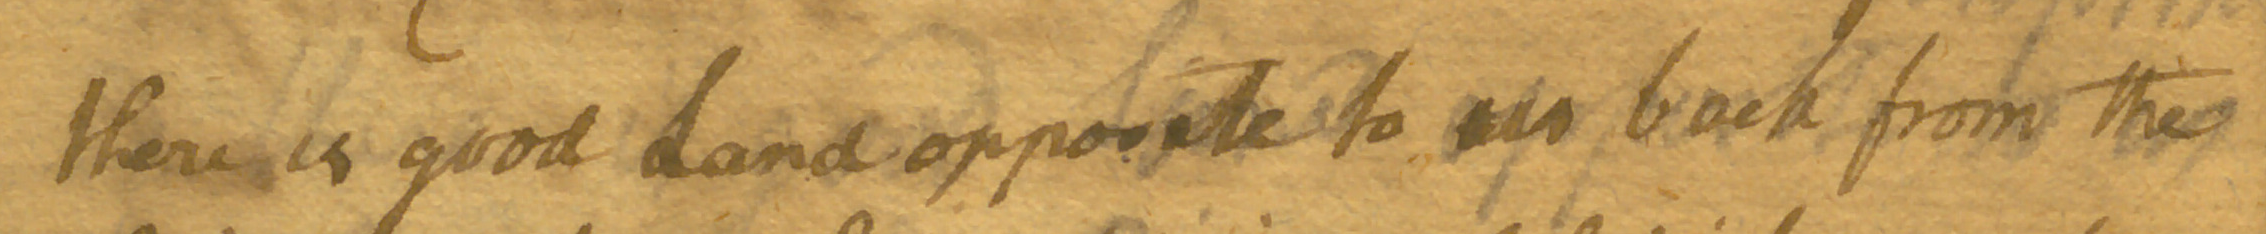there is good Land opposite to us back from the
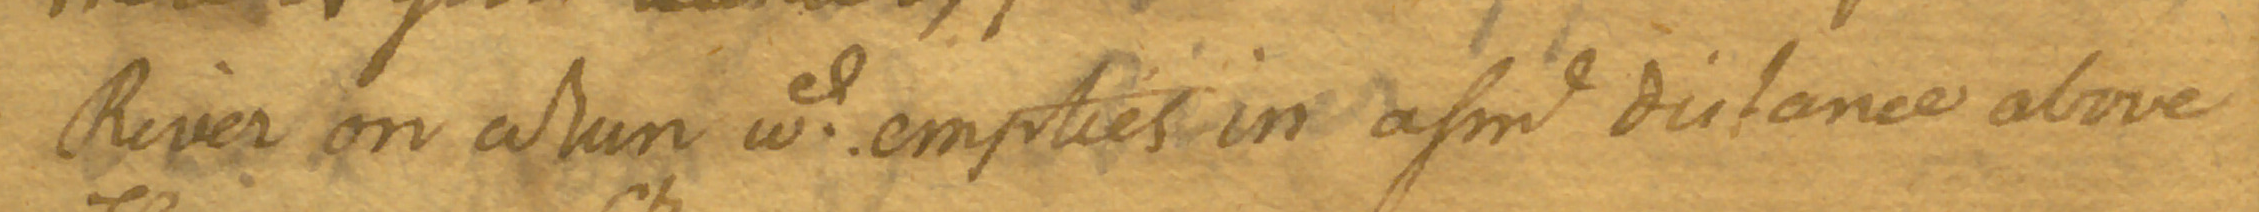River on a run w^ch. empties in a sm^l distance above
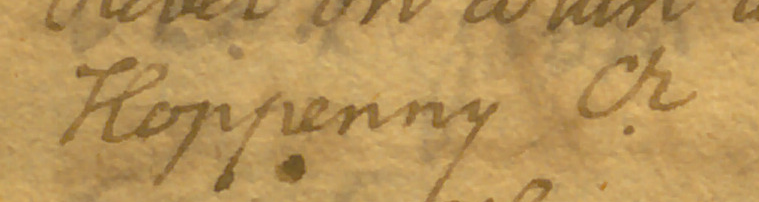Hoppeny C^r.
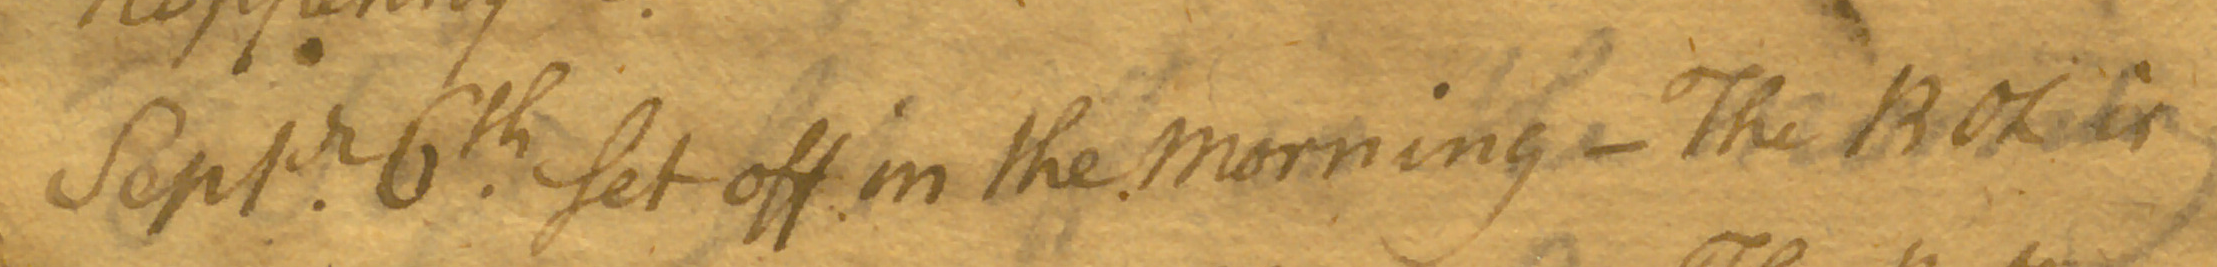Sept^r. 6^th. Set off in the morning- The B 0h is
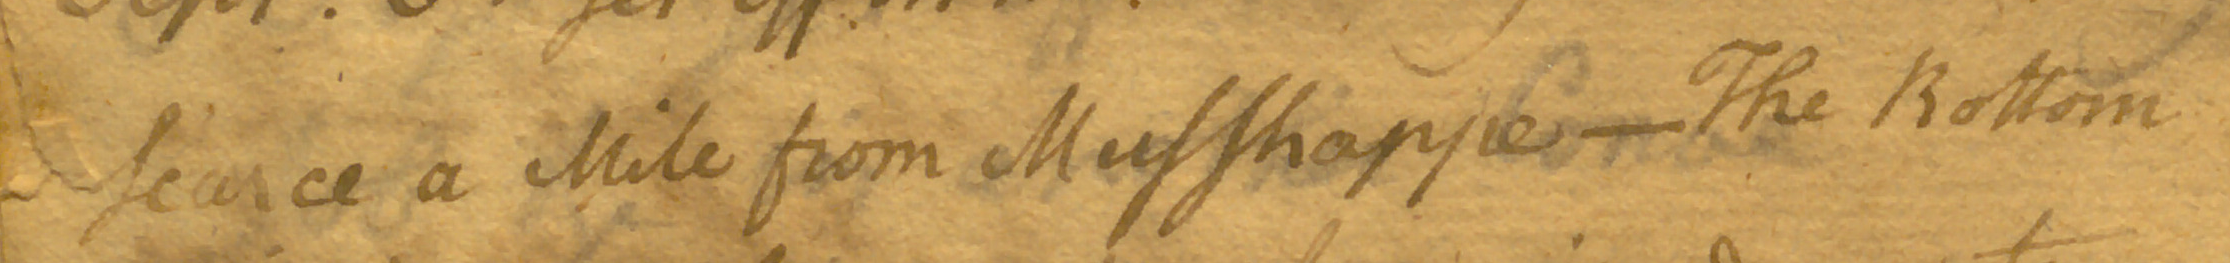scarce a mile from Musshappe- The Bottom
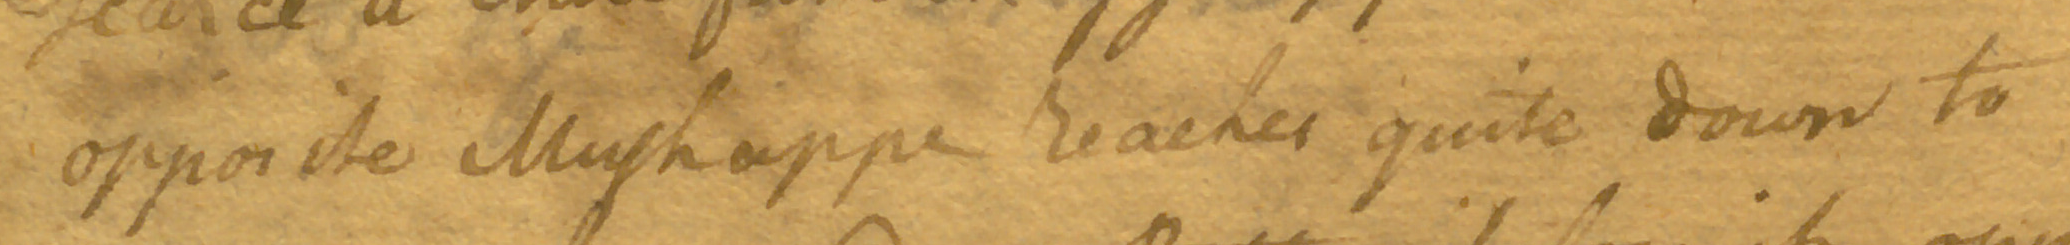opposite Mushappe reaches quite down to
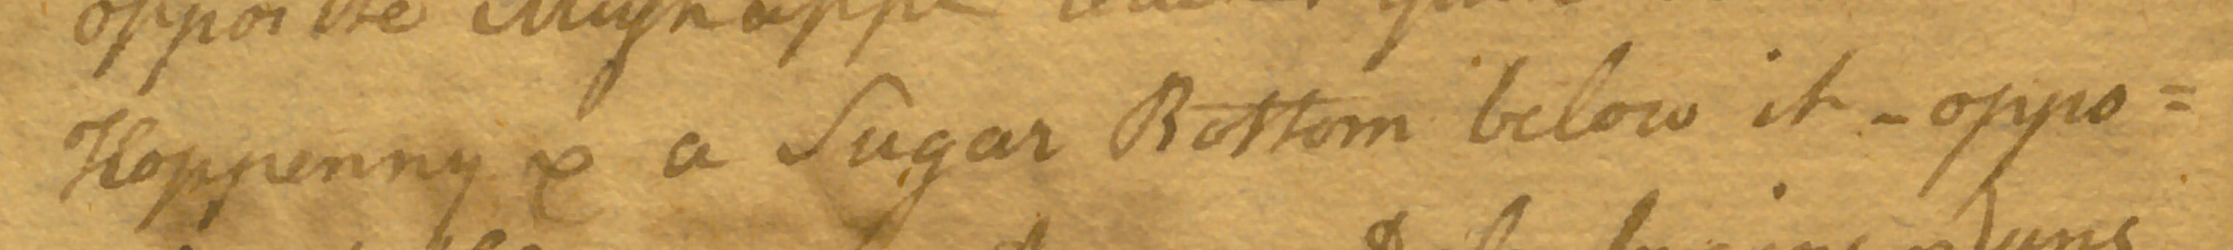Hoppenny & a sugar bottom below it- oppo-
